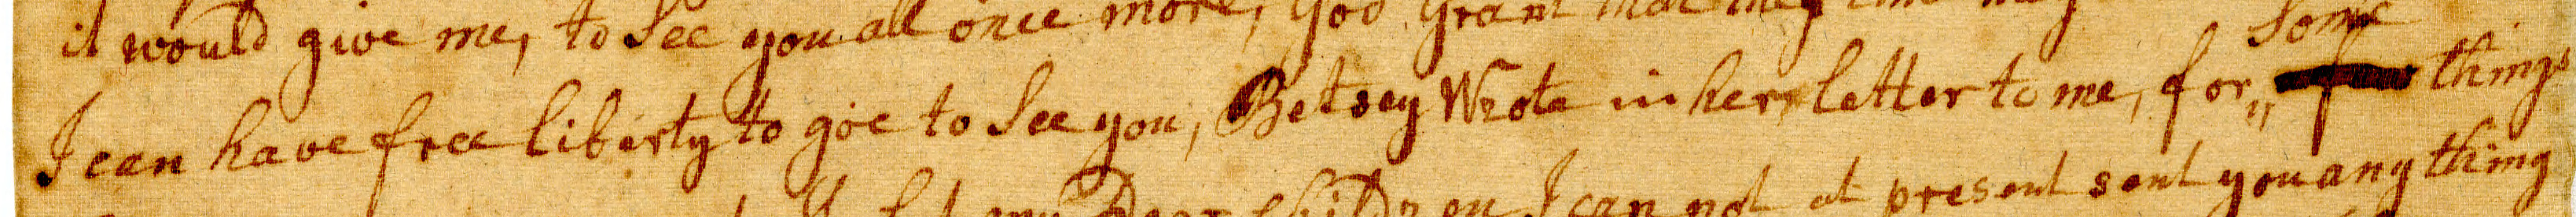I can have free liberty to goe to See you, Betsey wrote in her letter to me, for [______] things
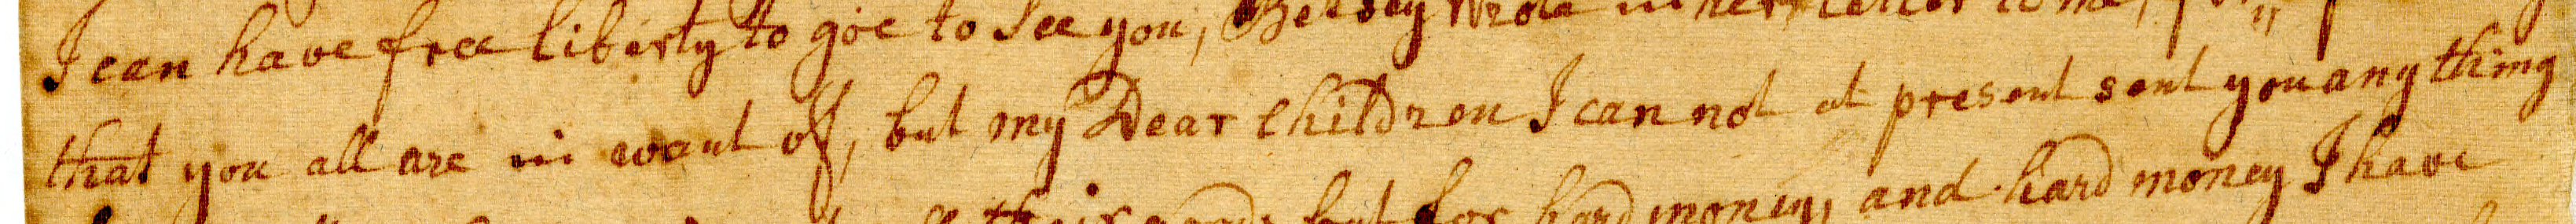that you all are in want of, but my Dear children I can not at present sent you any thing
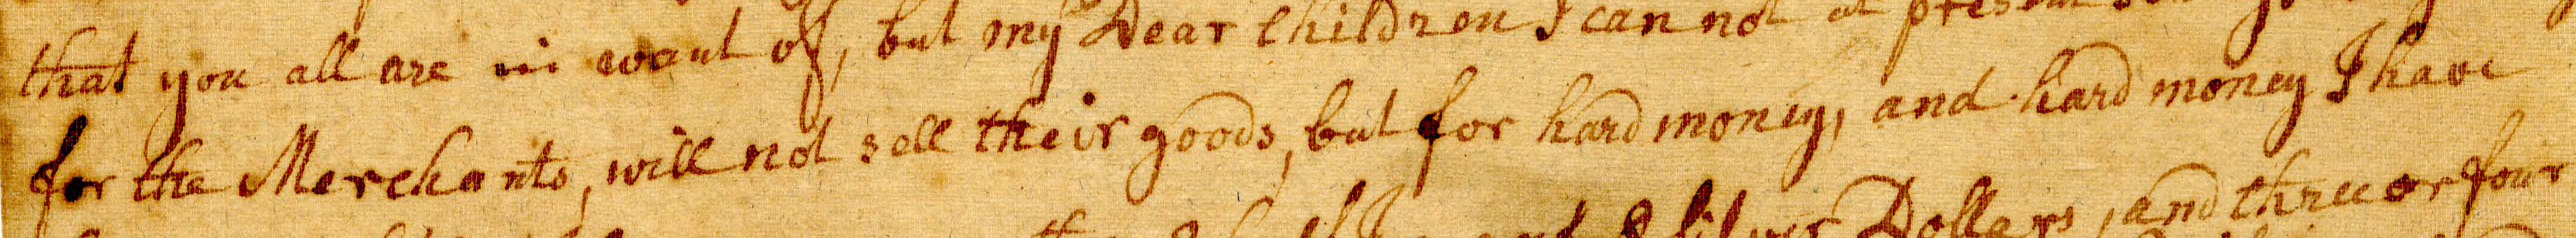for the Merchants will not sell their goods, but for hard money, and hard money I have
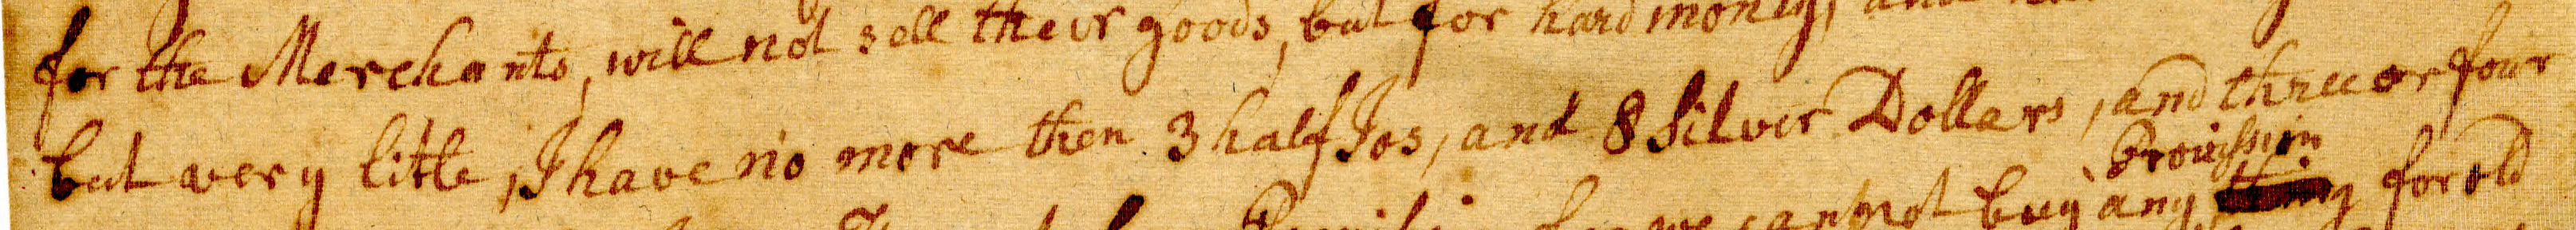but very little, I have no more than 3 half Jos, and 8 Silver Dollars, and three or four
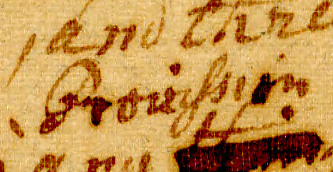Provision
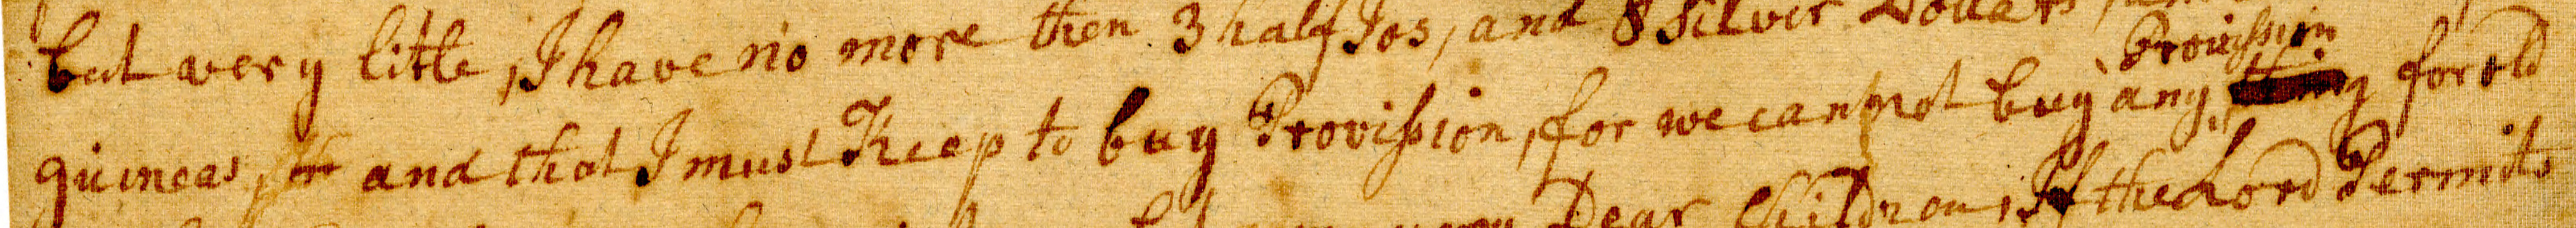guineas, and that I must keep to by Provision, for we cannot buy any [thing] for old
